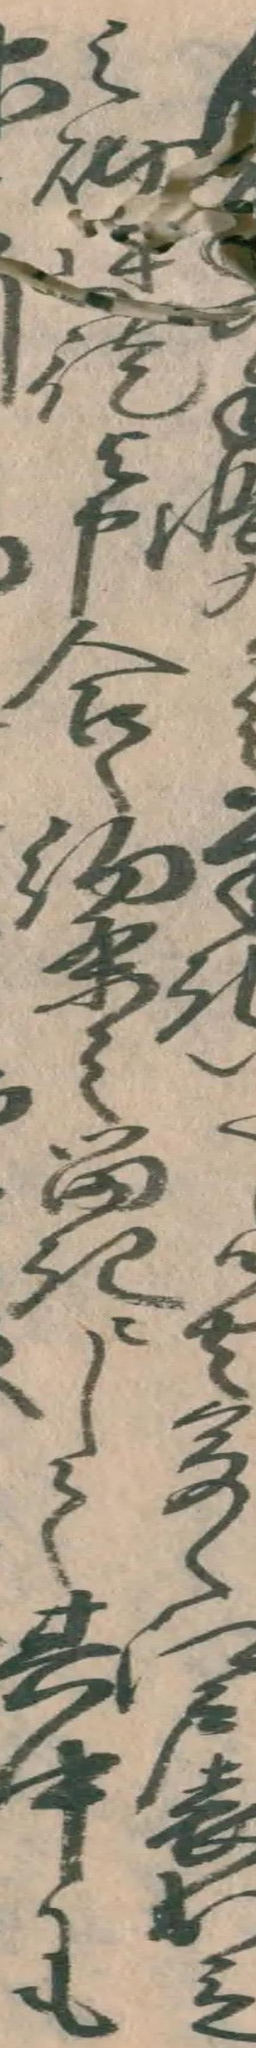之砌逆徒と申合之約条之留記ニして其中にも
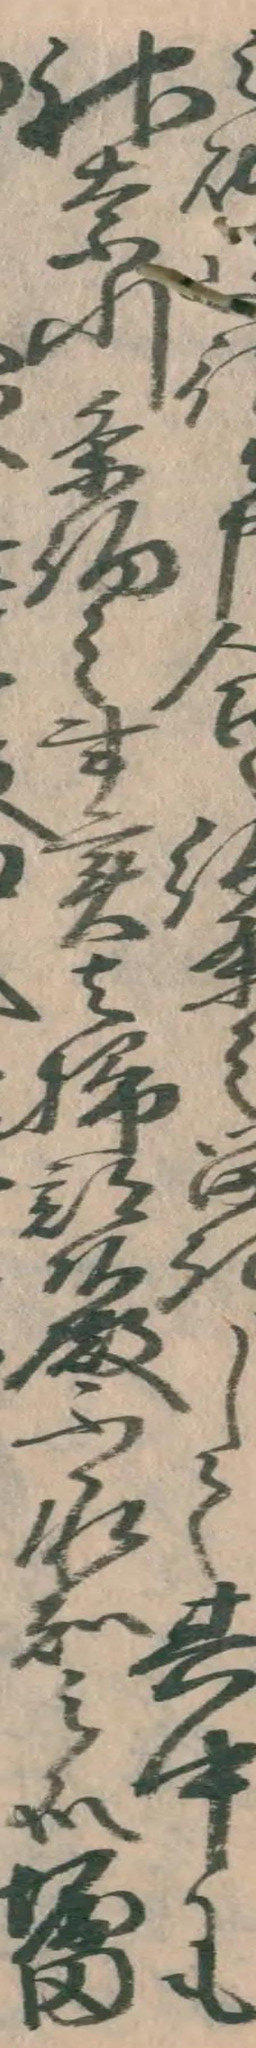神奈川条約之事実者掃部頭殿不承知之処堀田
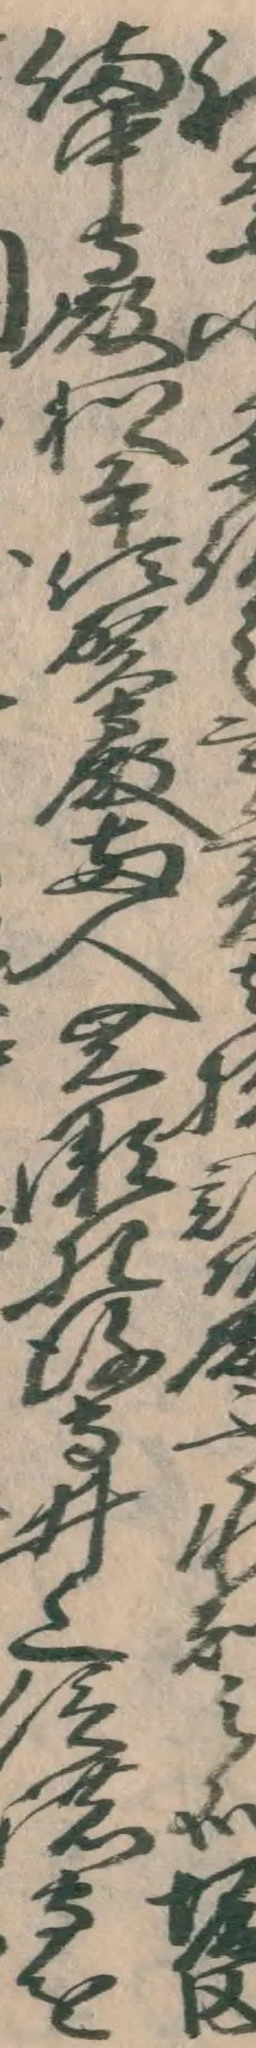備中守殿松平伊賀守殿両人岩瀬肥後守井上信濃守を
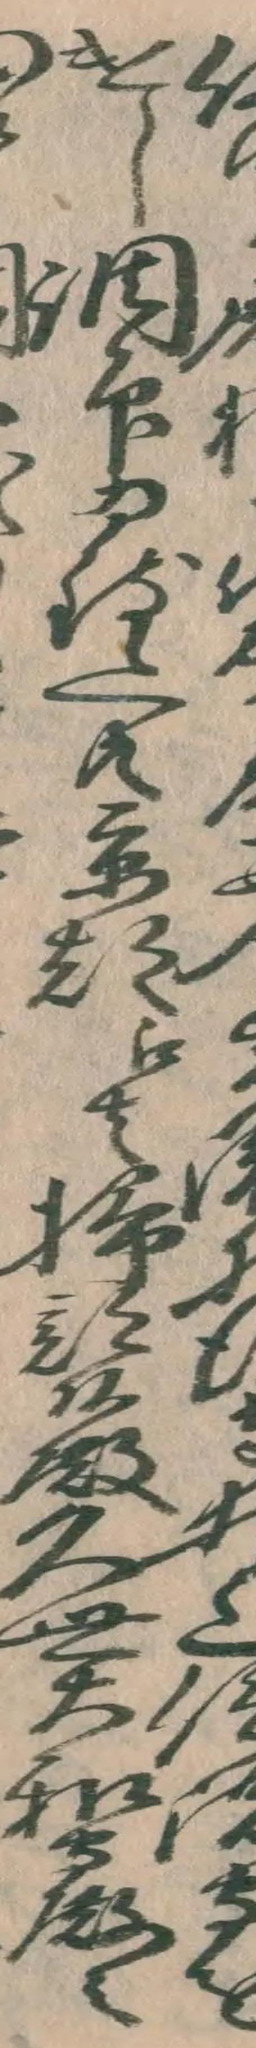遣し調印為致候へ共京都江者掃部頭殿久世大和守殿之
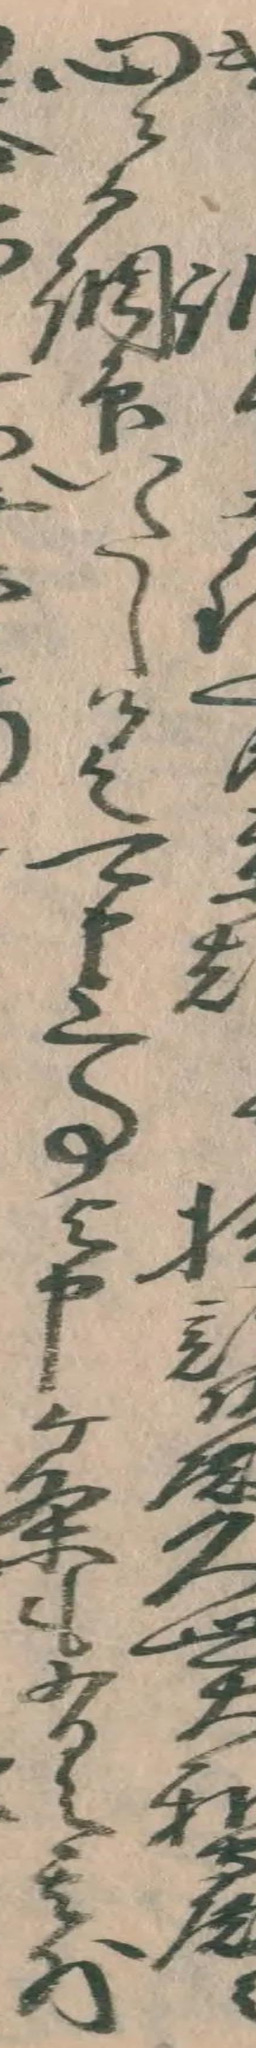心ニ而調印いたし候と可申上事と申ケ条も有之其外
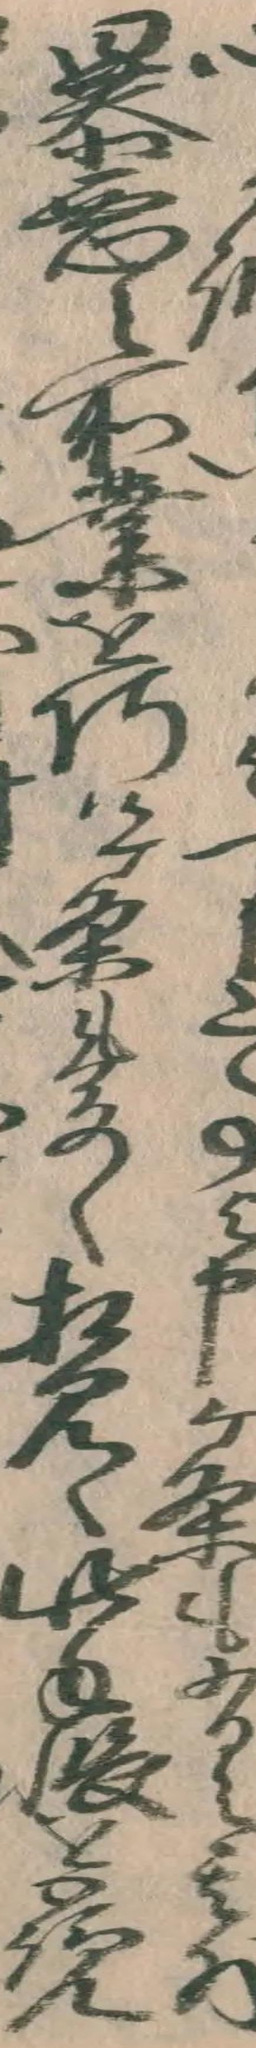暴悪之所業を巧候ケ条斗多く相見候此手帳を御覧
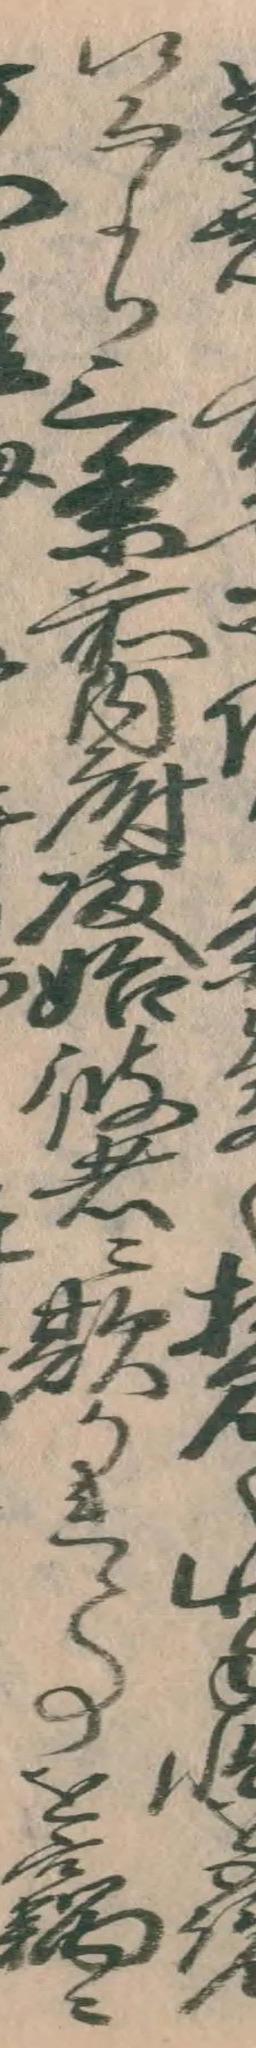候而より三条前内府殿始彼者ニ欺かれ候事を竊ニ
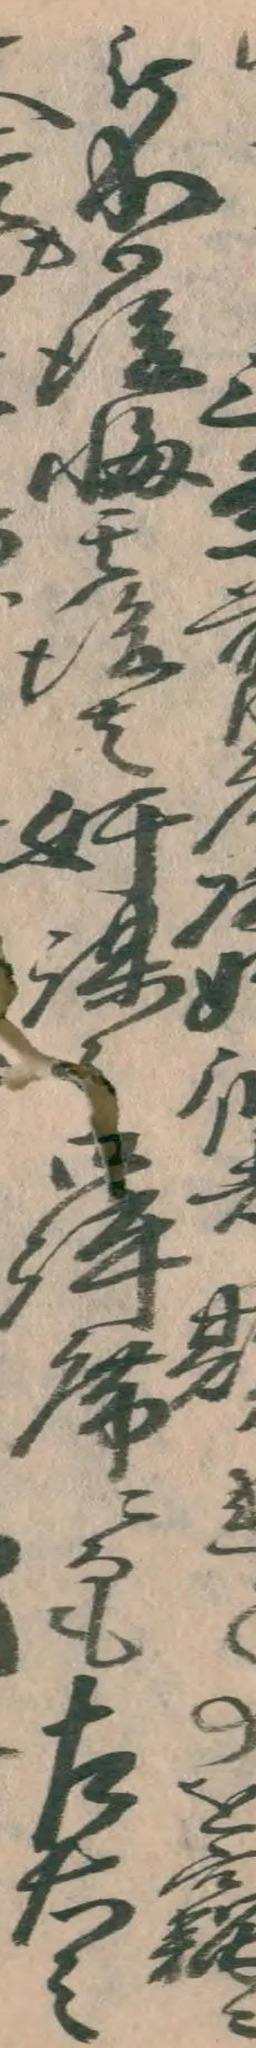被成御後悔其後者奸謀之御評席ニ而も左右之
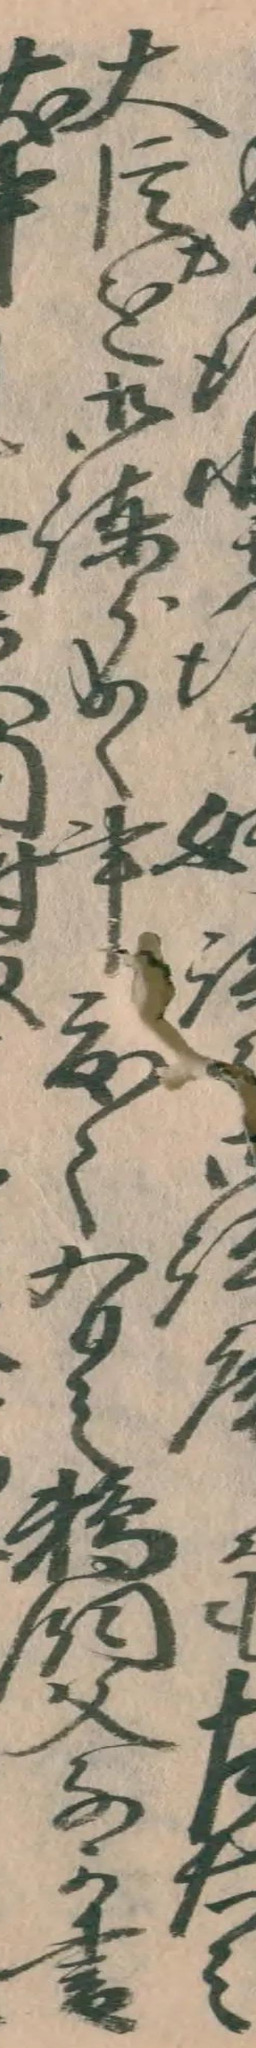大臣方を御諫被成候事度々有之鵜飼父子か書
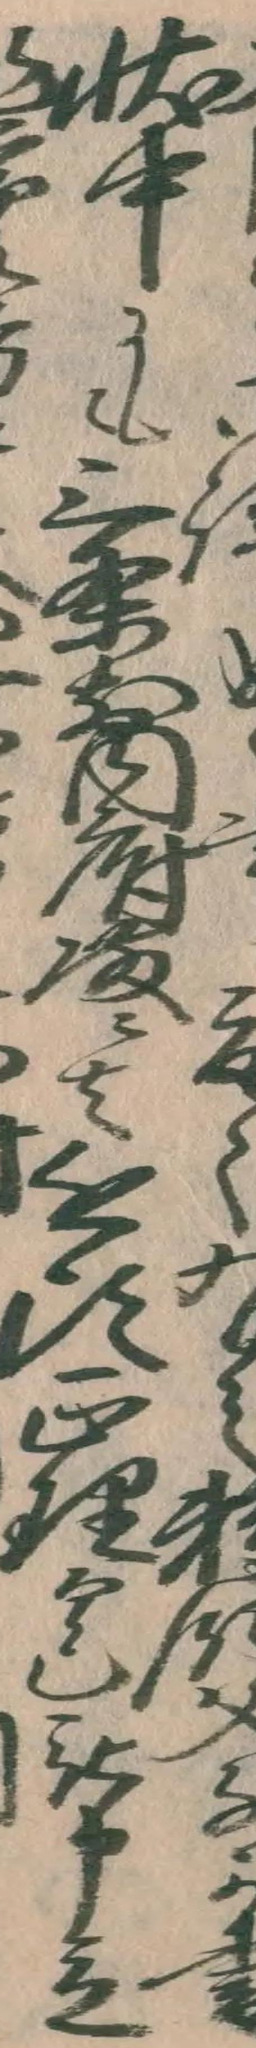状中にも三条前内府殿ニ者近頃正理而已被申立
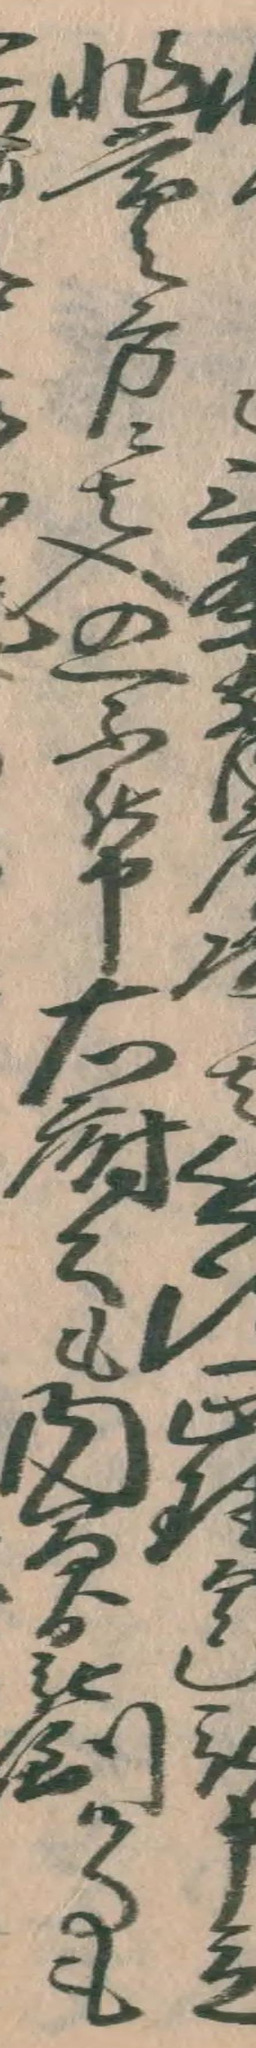非常之方ニ者入込不被申右府公も内間ゟ被倒候事も
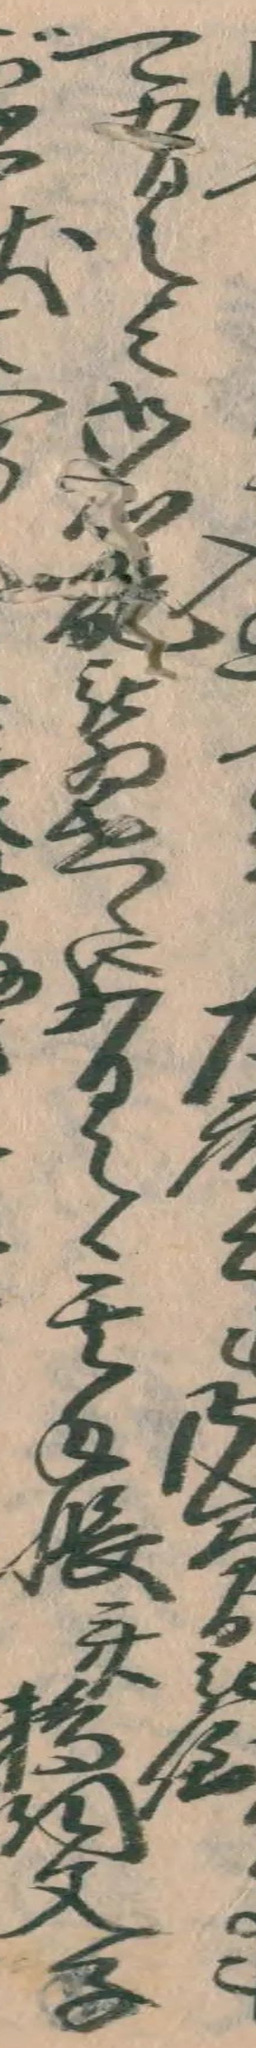可有之と御心配被為在候由有之候其手帳幷鵜飼父子
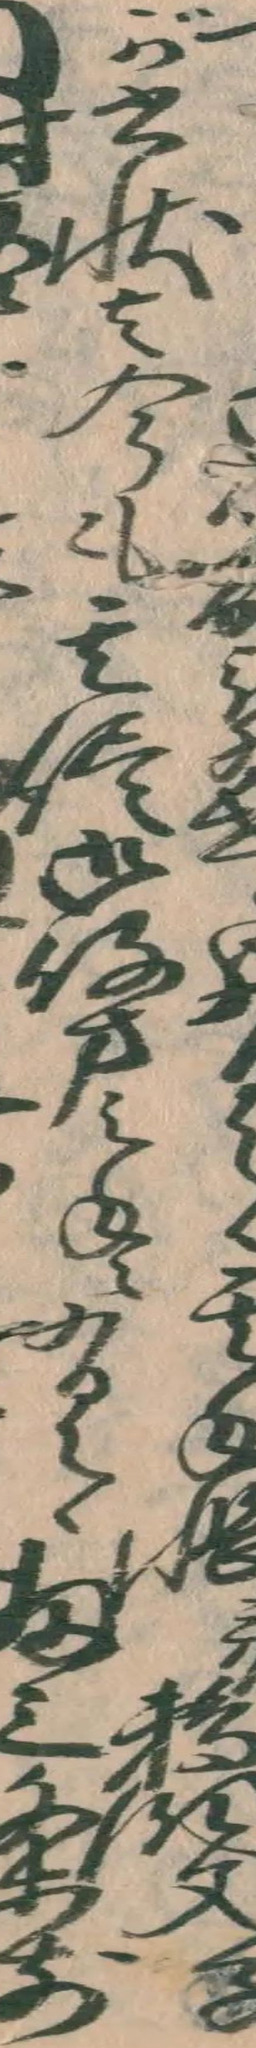が書状者今も其儘御役方之手ニ有之候扠三条前
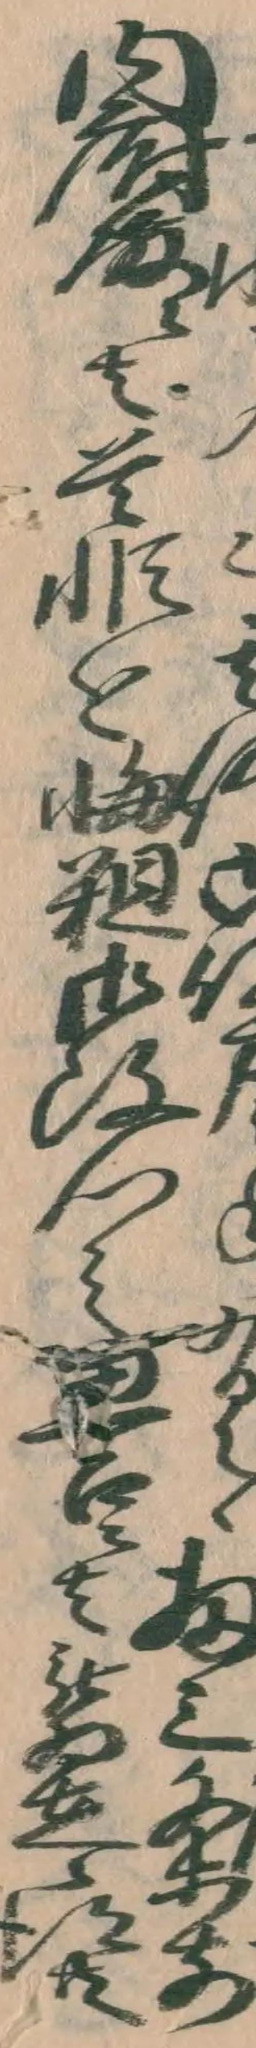内府殿ニ者是非を悔粗御改心之思召ニ者被為在候得共
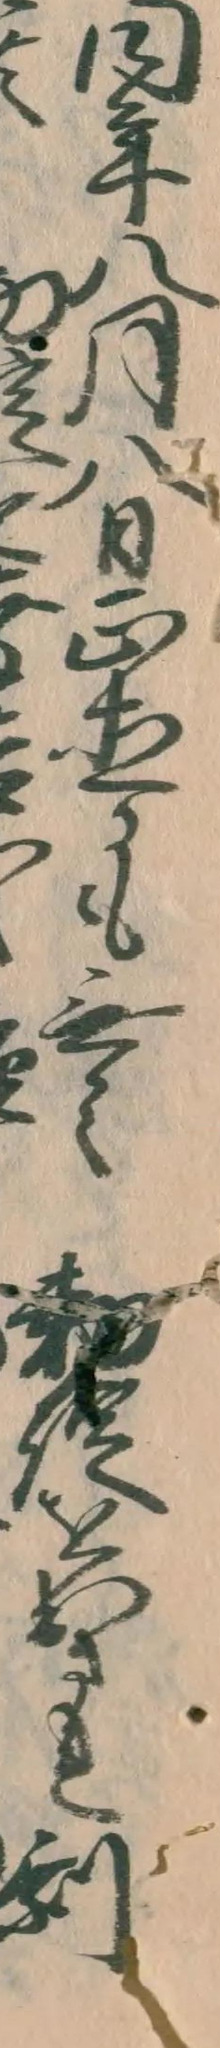同年八月八日正直にも無之勅諚を出され剰
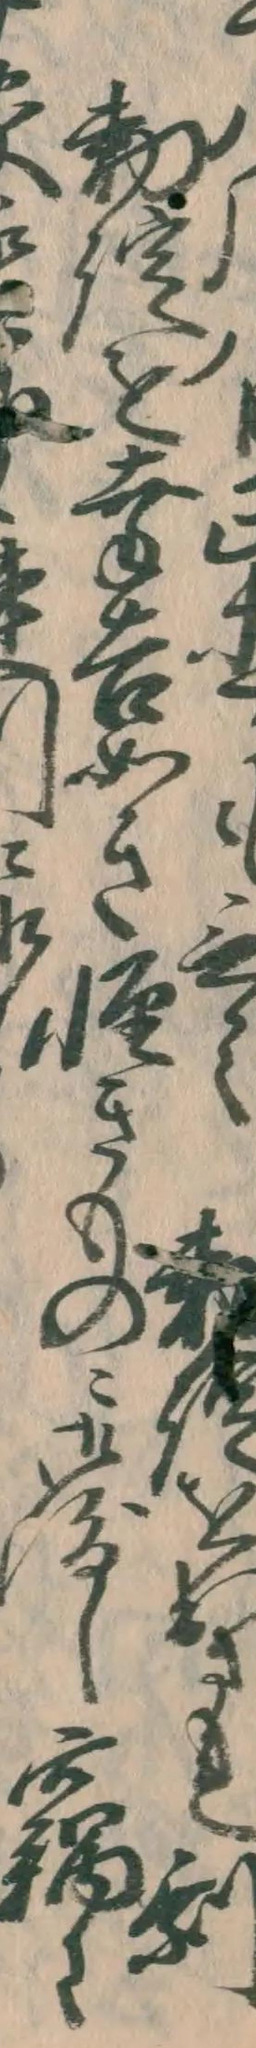其勅諚を幸吉如き軽きものニ御渡し竊に
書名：麗斎叢書. 20
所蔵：国立国会図書館 National Diet Library, JAPAN
